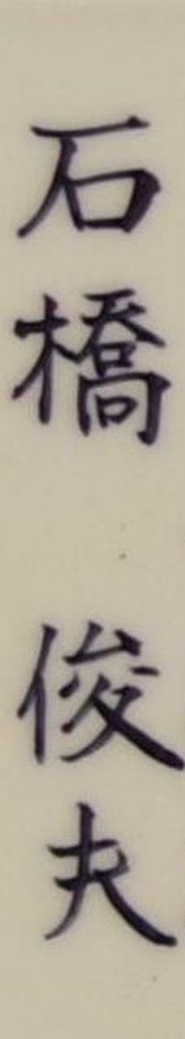石橋俊夫

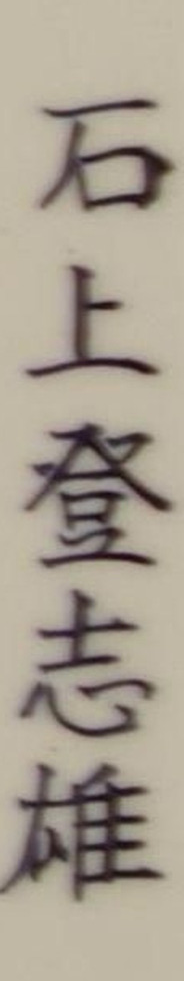石上登志雄
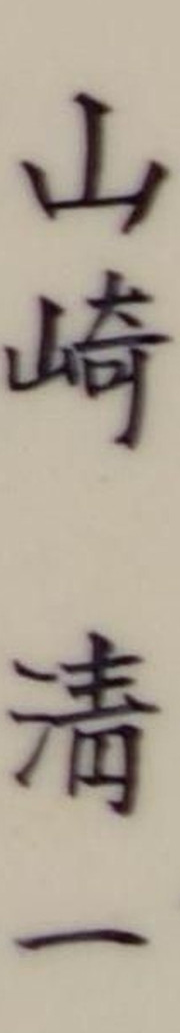山崎清一
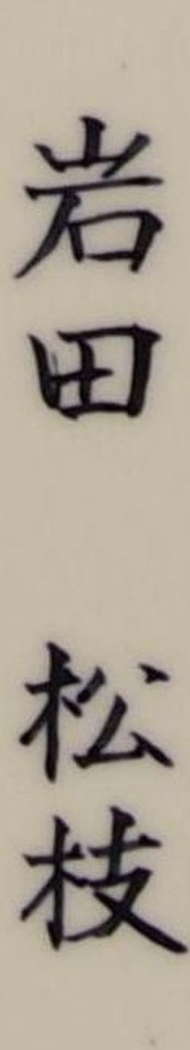岩田松枝
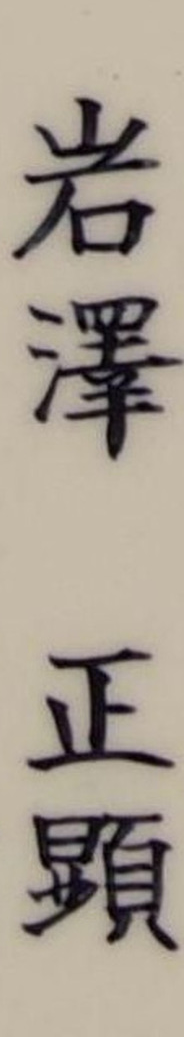岩澤正顕
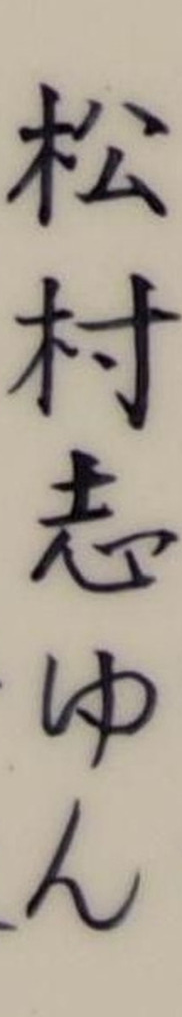松村しゆん
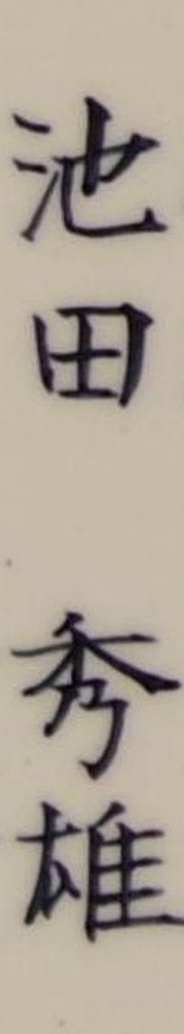池田秀雄
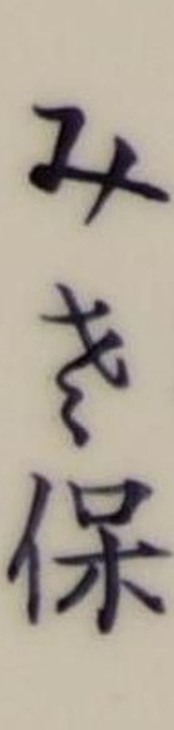みさほ

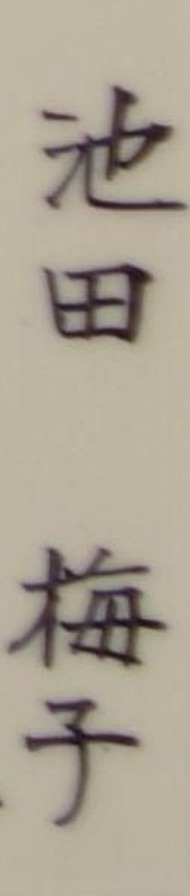池田梅子
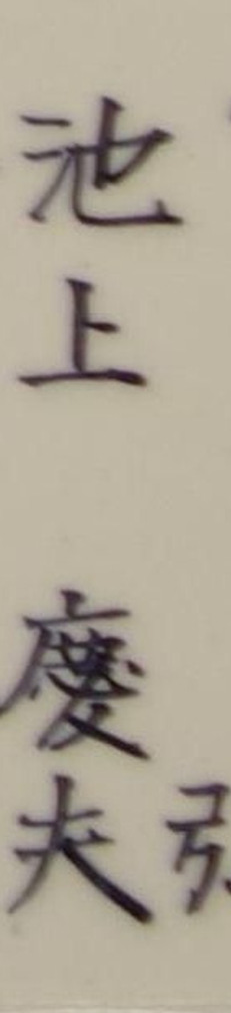池上慶夫
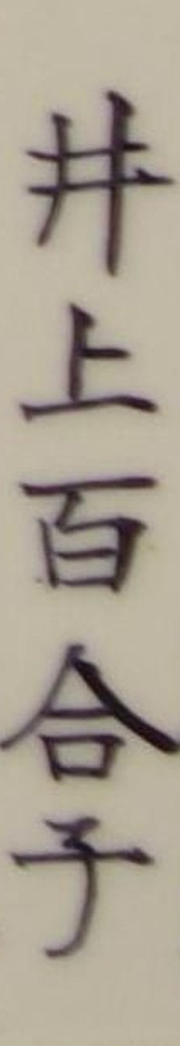井上百合子
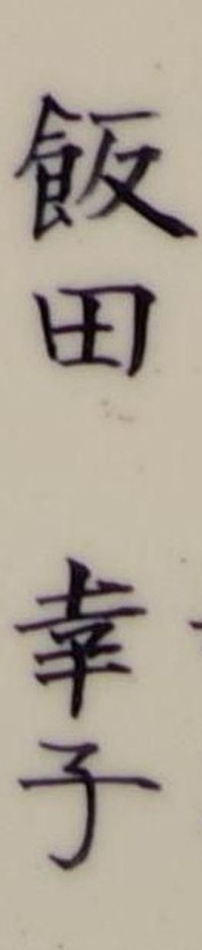飯田幸子
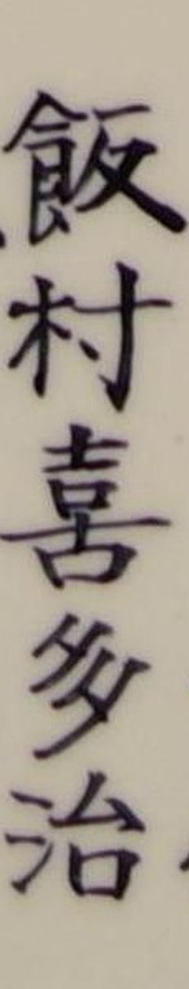飯村喜多治
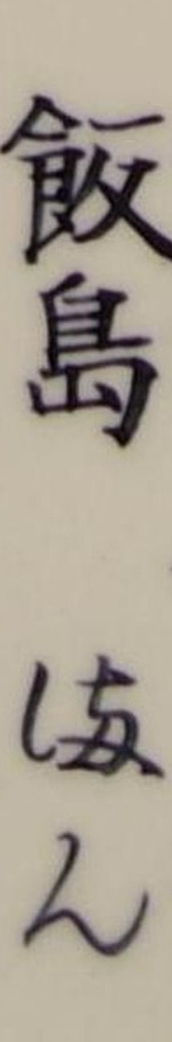飯島まん
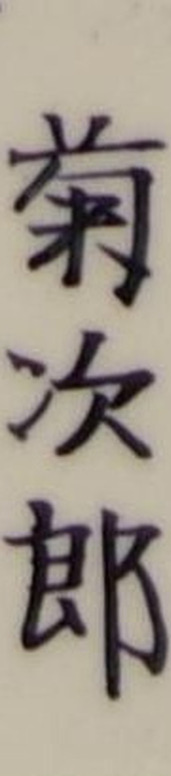菊次郎
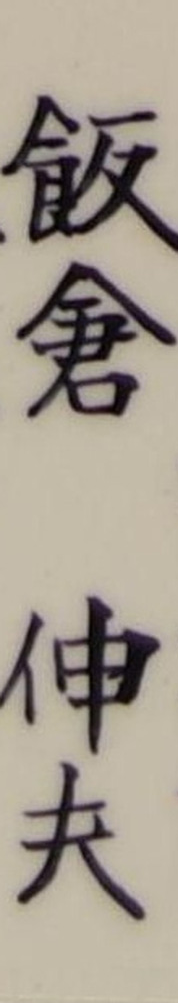飯倉伸夫
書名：M~S
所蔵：高野山金剛峯寺
